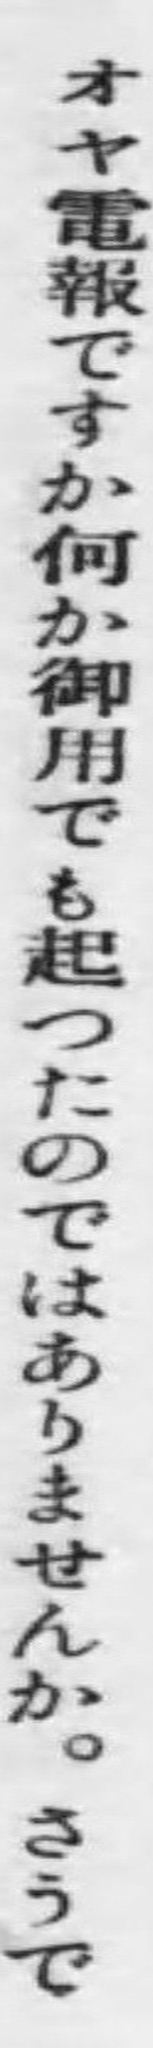オヤ電報ですか何か御用でも起つたのではありませんか。さうで
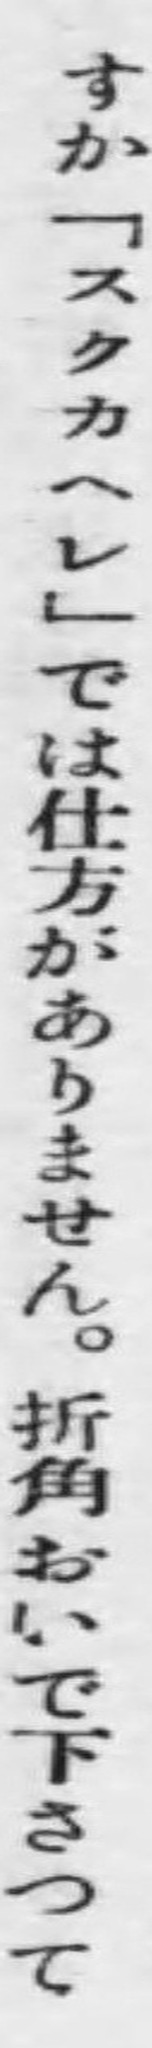すか「スクカヘレ」では仕方がありません。折角おいで下さつて
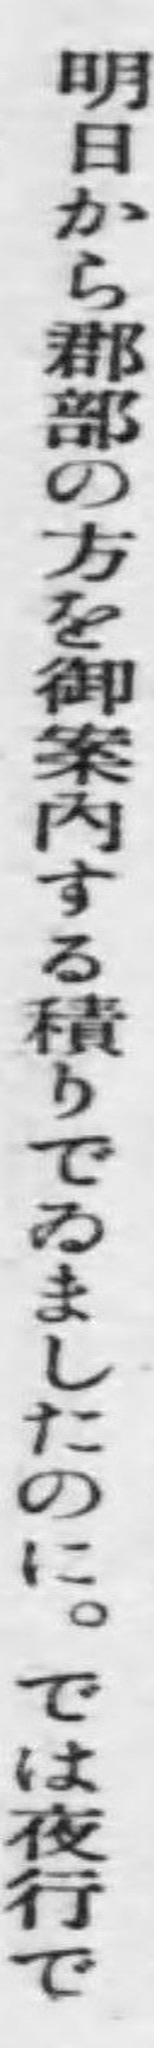明日から郡部の方を御案内する積りでゐましたのに。では夜行で
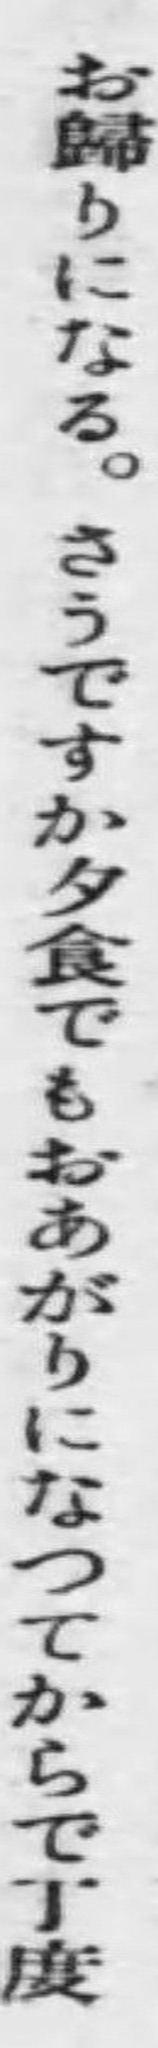お帰りになる。さうですか夕食でもおあがりになつてからで丁度
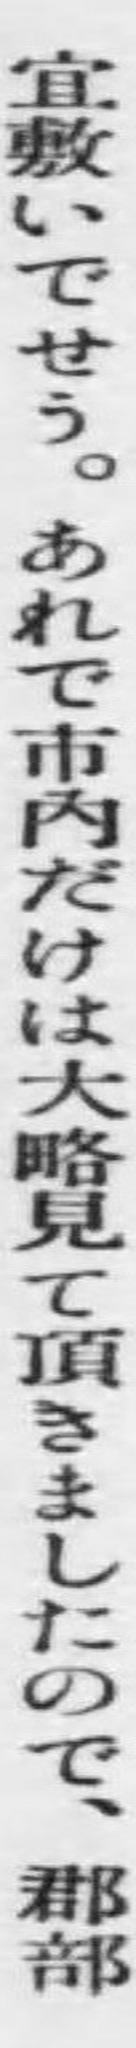宜敷いでせう。あれで市内だけは大略見て頂きましたので、郡部
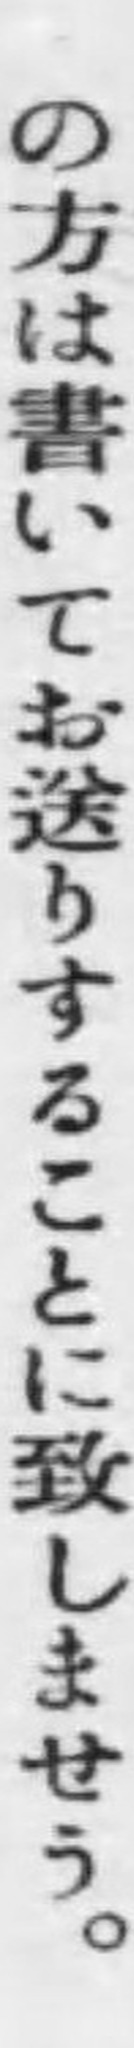の方は書いてお送りすることに致しませう。

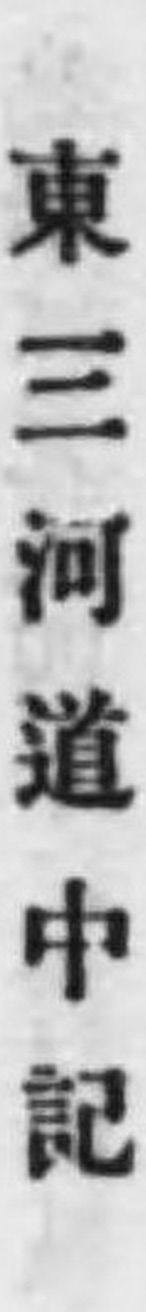東三河道中記下
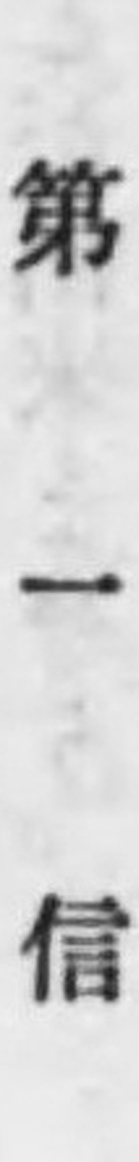第一信
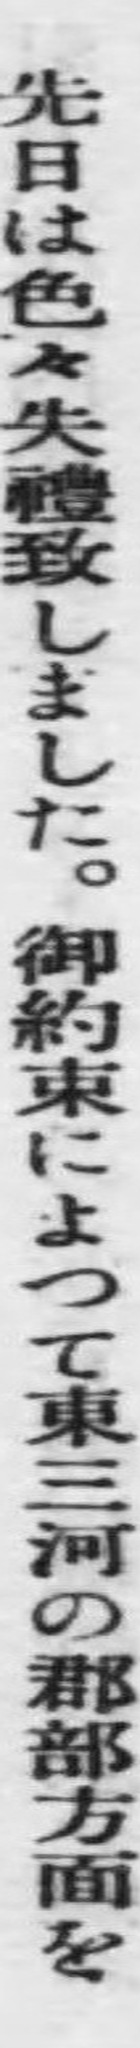先日は色々失礼致しました。御約束によつて東三河の郡部方面を
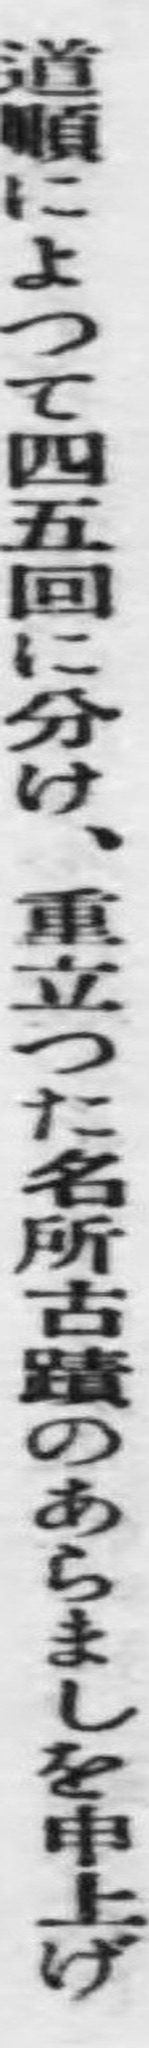道順によつて四五回に分け、重立つた名所古蹟のあらましを申上げ
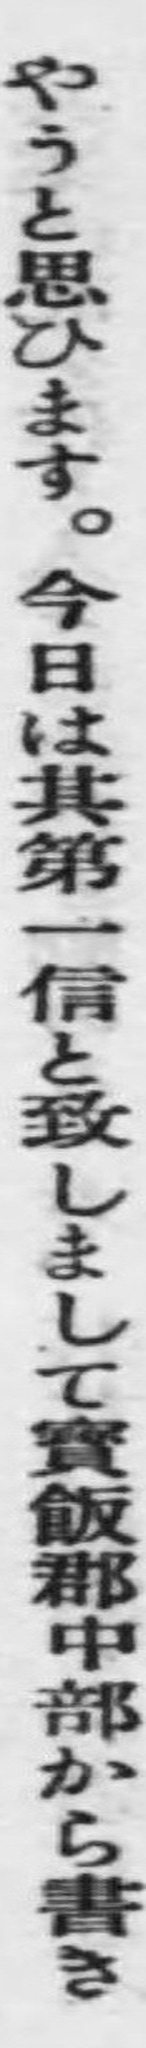やうと思ひます。今日は其第一信と致しまして宝飯郡中部から書き
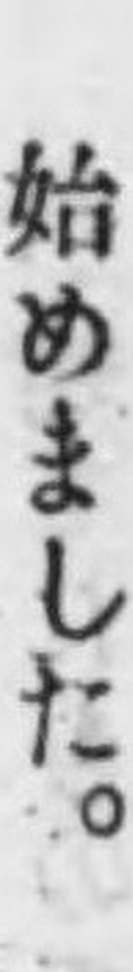始めました。
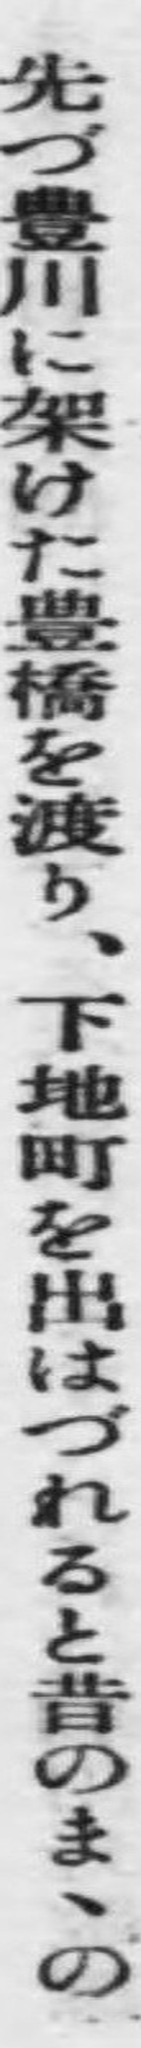先づ豊川に架けた豊橋を渡り、下地町を出はづれると昔のまゝの
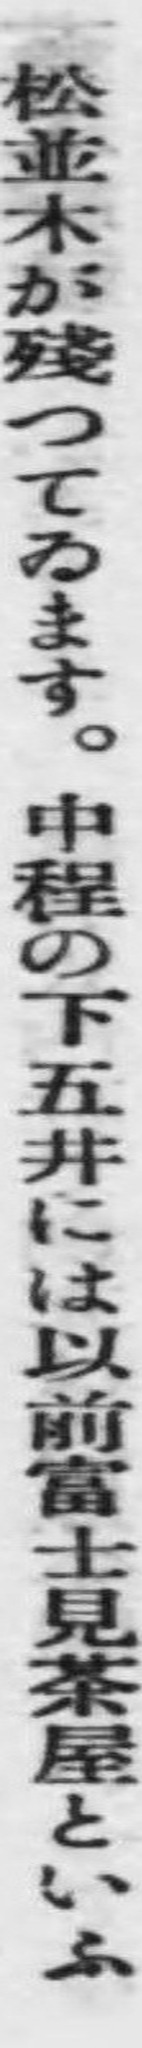松並木が残つてゐます。中程の下五井には以前富士見茶屋といふ
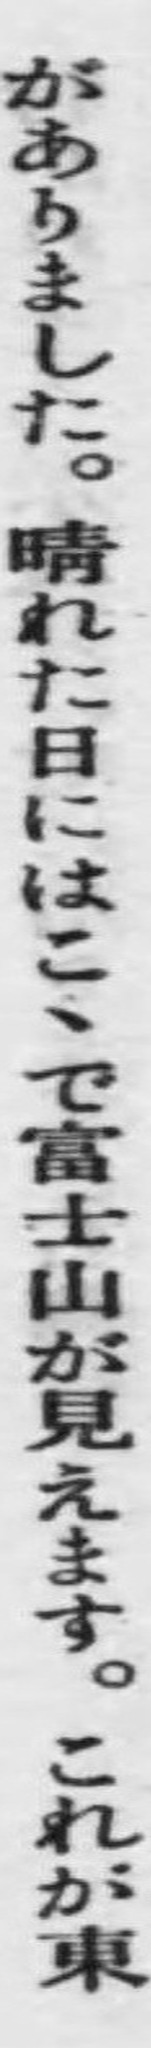がありました。晴れた日にはこゝで富士山が見えます。これが東
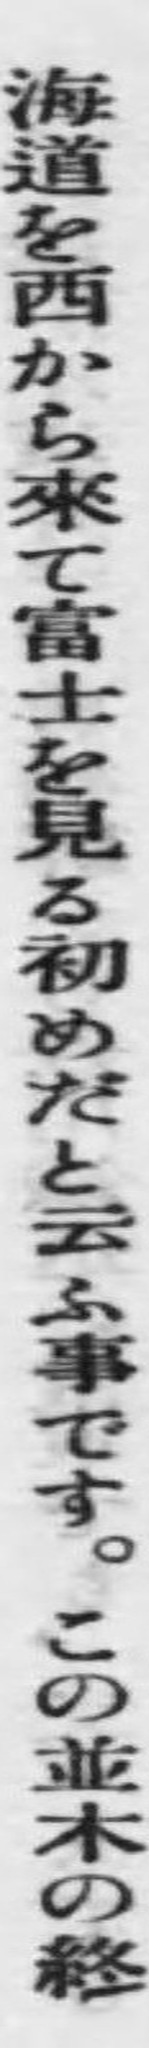海道を西から来て富士を見る初めだと云ふ事です。この並木の終
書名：東三河道中記 : 豊橋市及其附近案内
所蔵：国立国会図書館 National Diet Library, JAPAN
